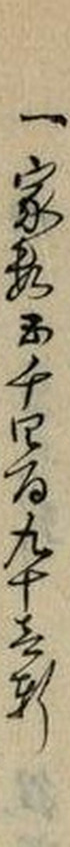一家数五千四百九十壱軒
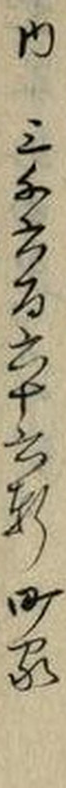内三千六百六十六軒町家
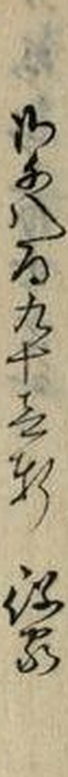弐千八百九十壱軒役家
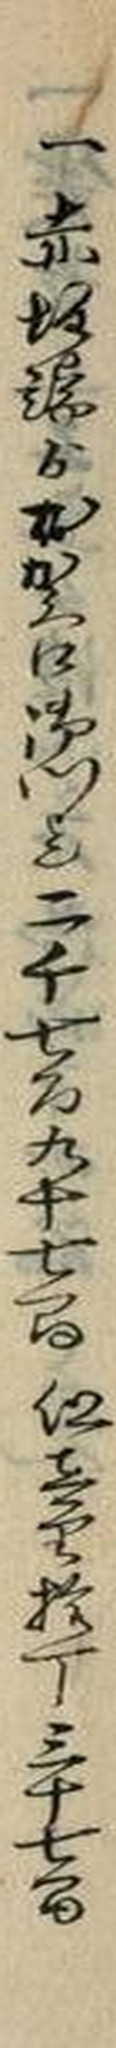一赤坂端ゟ加賀口御門迄二千七百九十七間但壱里拾丁三十七間
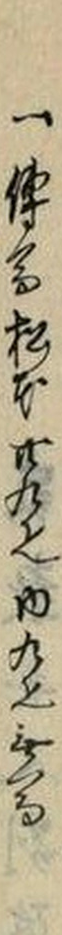一伝馬松本廿九疋内九疋無馬
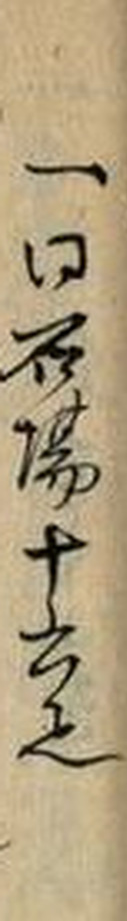一同石場十六疋
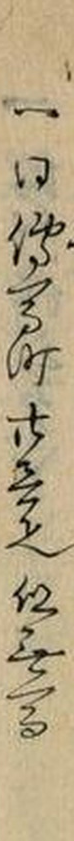一同伝馬町廿壱疋但無馬
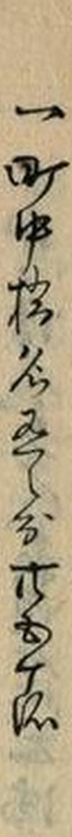一町中橋名有之分廿五ケ所
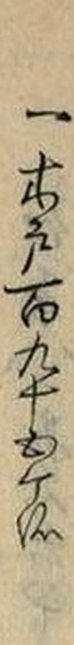一木戸百九十五ケ所
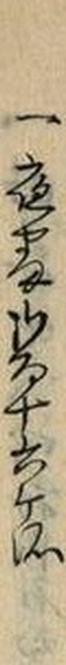一夜番弐百十六ケ所
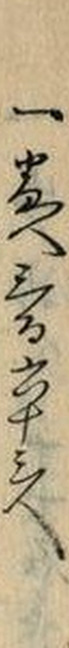一番人三百六十三人
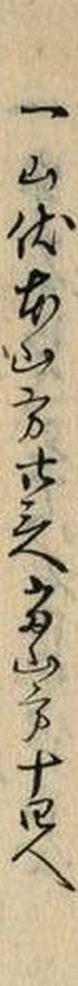一山伏本山方廿三人当山方十四人
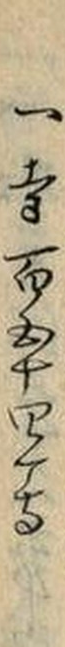一寺百五十四ケ寺
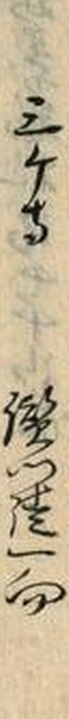三ケ寺讃門徒一向
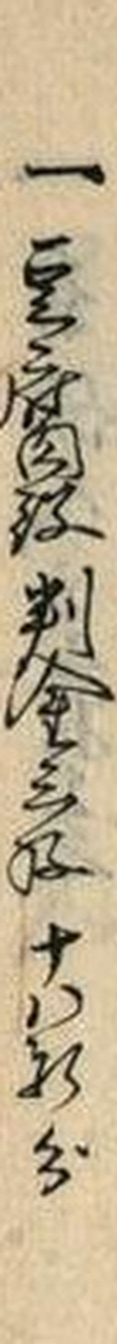一豆腐役判金三枚十八軒分
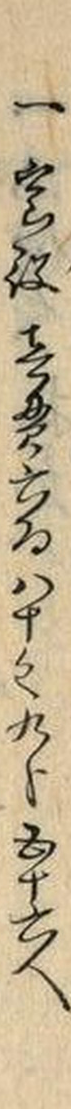一室役壱貫六百八十匁九分五十六人
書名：御国他国諸事之部
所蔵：福井県文書館 Fukui Prefectural Archives
